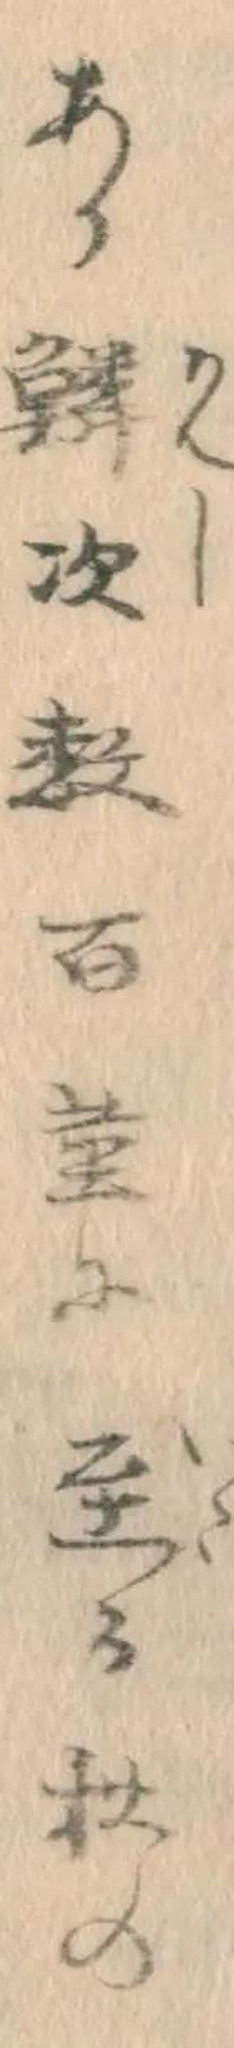あり鱗次数百茎に至る秋の
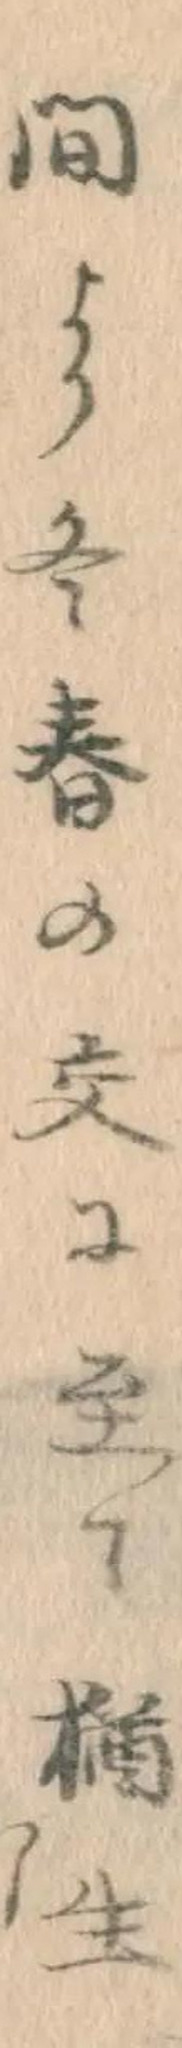間より冬春の交に至て猶生
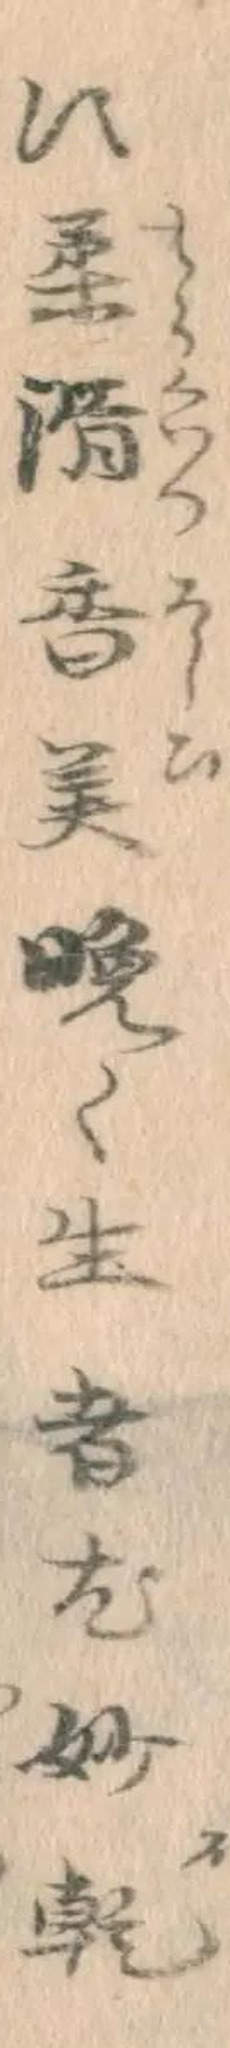す柔滑香美晩く生者尤妙乾
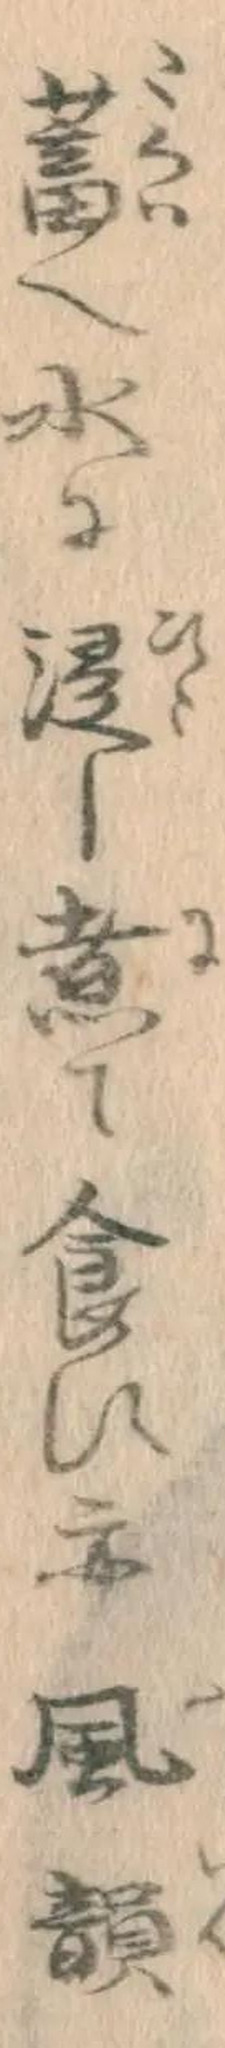蓄へ水に浸し煮て食す亦風韻
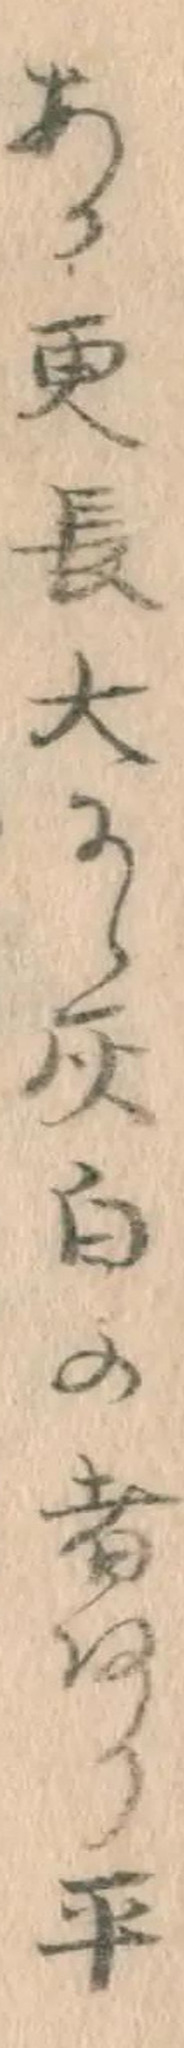あり更長大にし灰白の者あり平
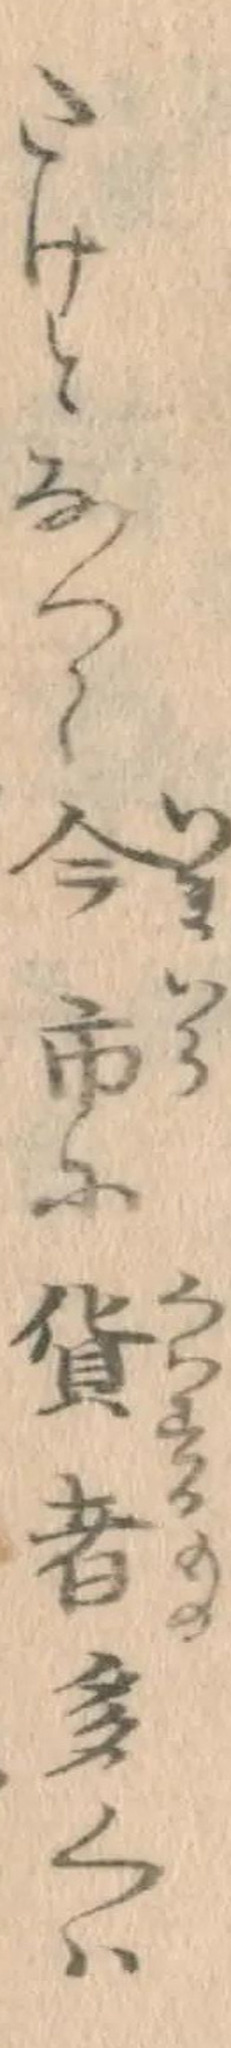たけとなつ今市に貨者多くは
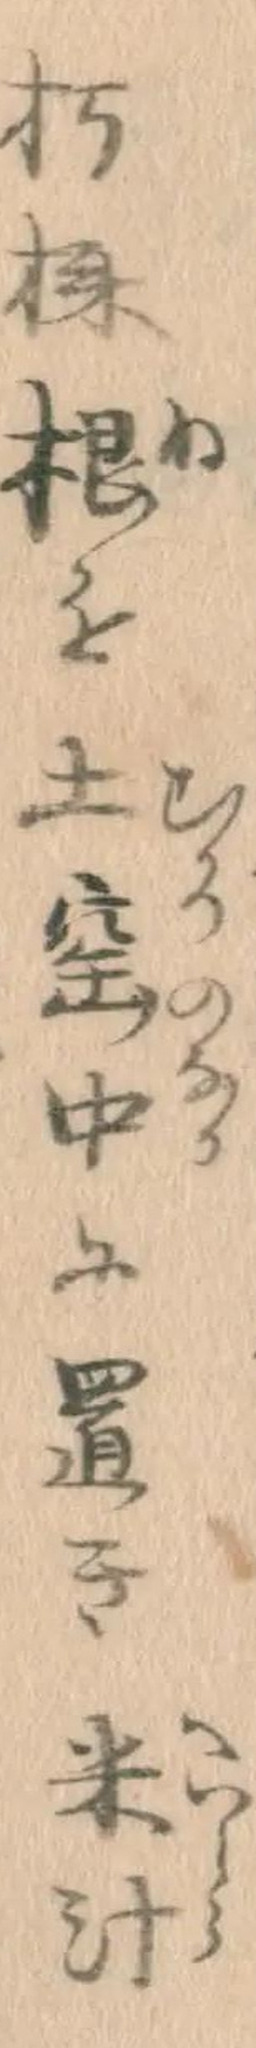朽株根を土窯中に置き米汁
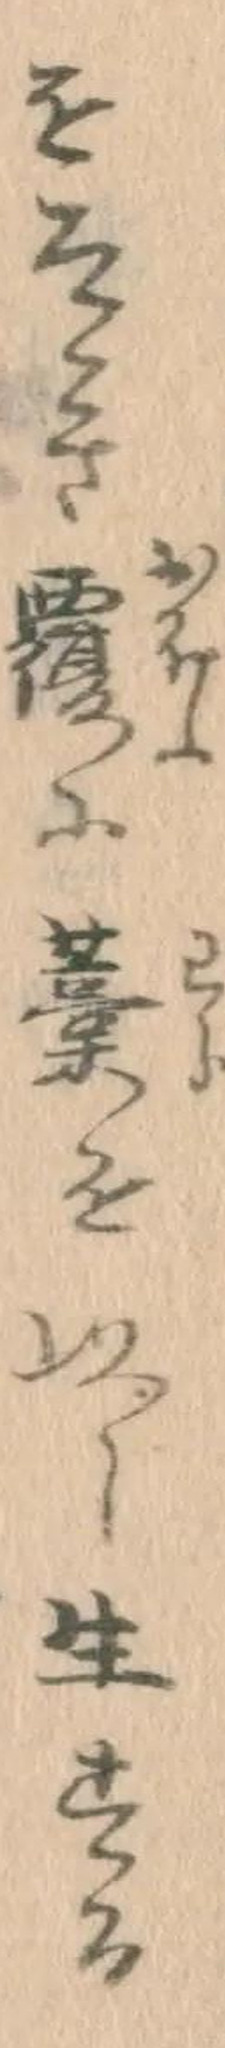をそゝき覆に藁を以し生する
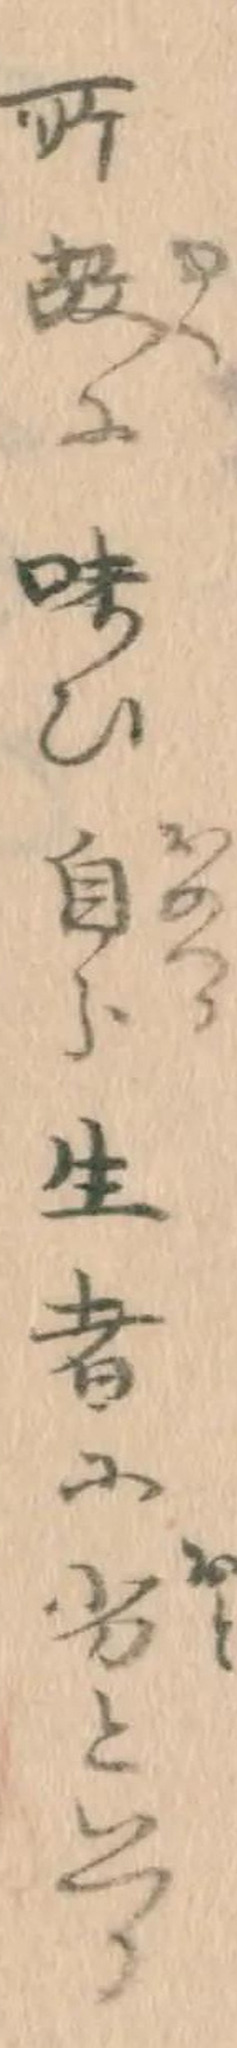所故に味ひ自ら生者に劣といへり
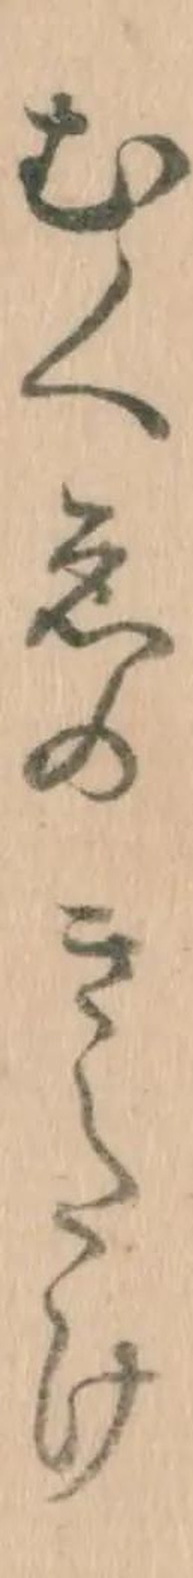むくゑのきたけ
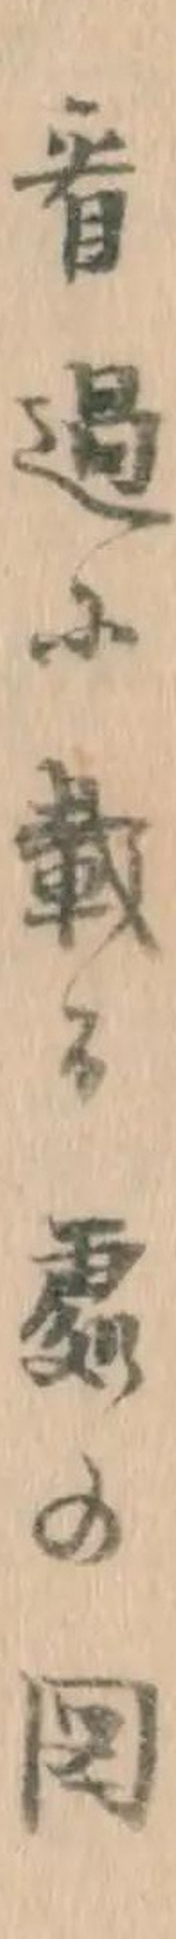看過に載る処の図
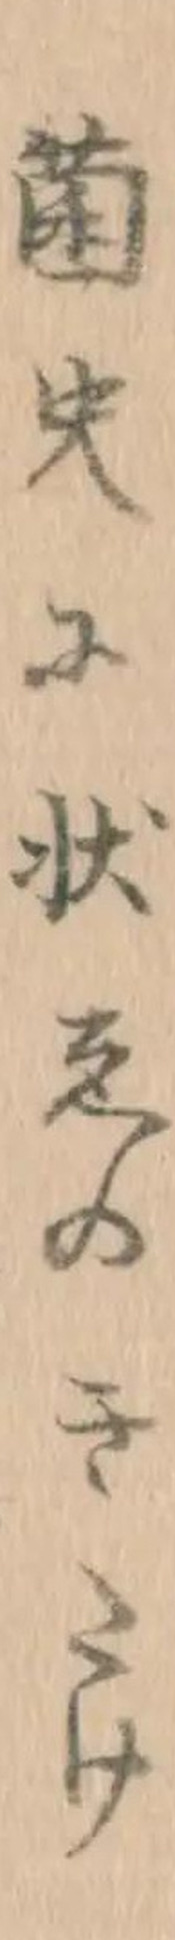菌史に状ゑのきたけ
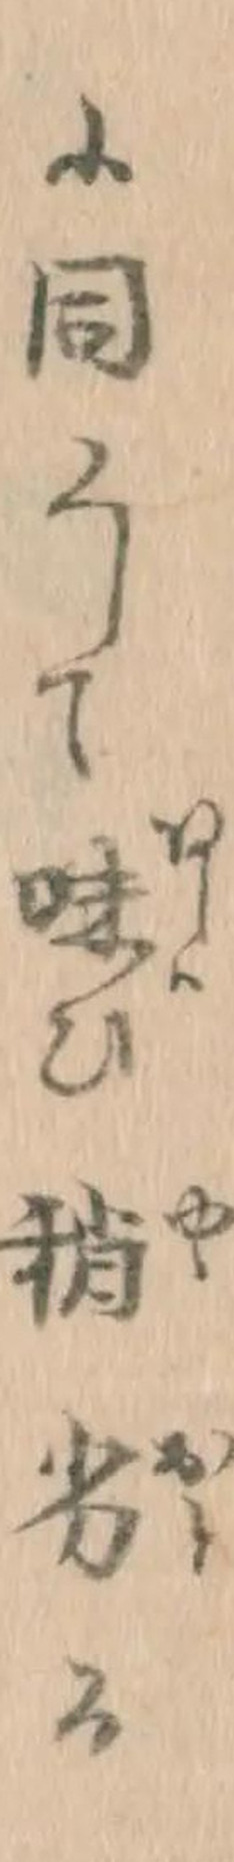に同くして味ひ稍劣る
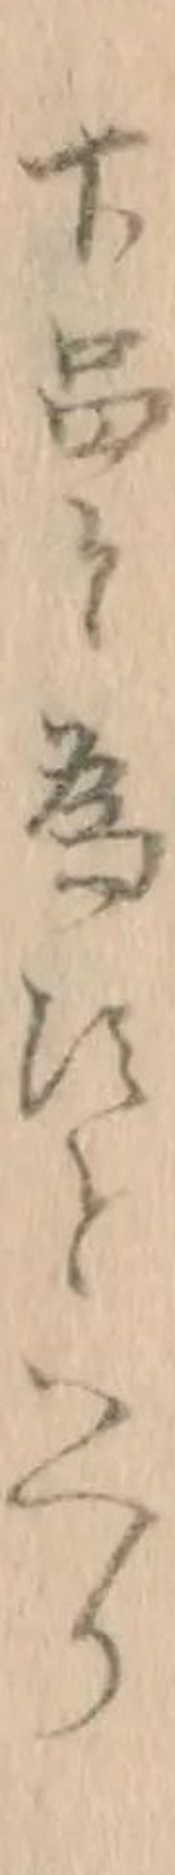下品と為すといへり

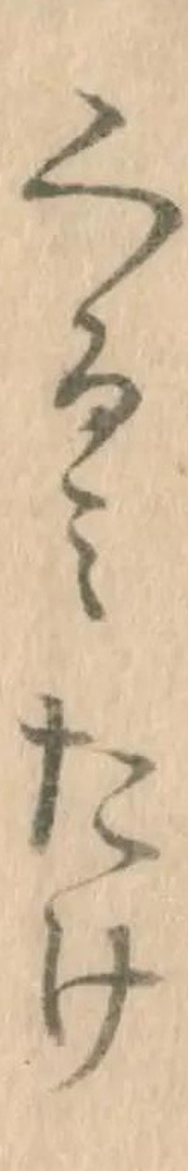くるみたけ
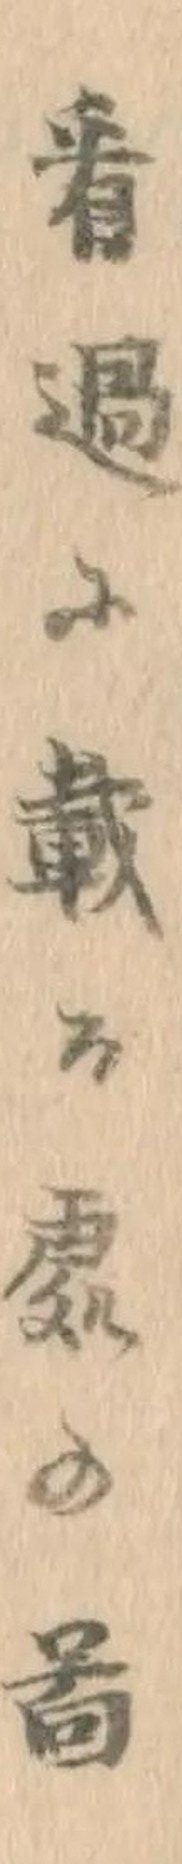看過に載る処の図
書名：本草図譜. 巻55-57
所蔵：国立国会図書館 National Diet Library, JAPAN
